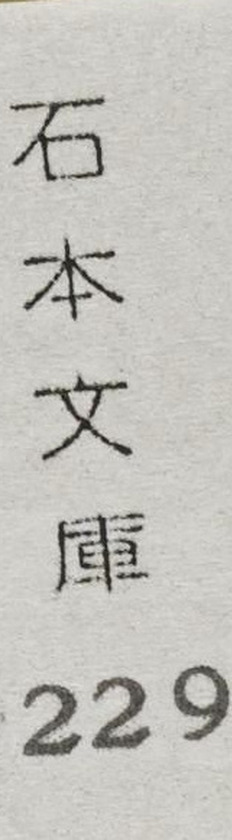石本文庫
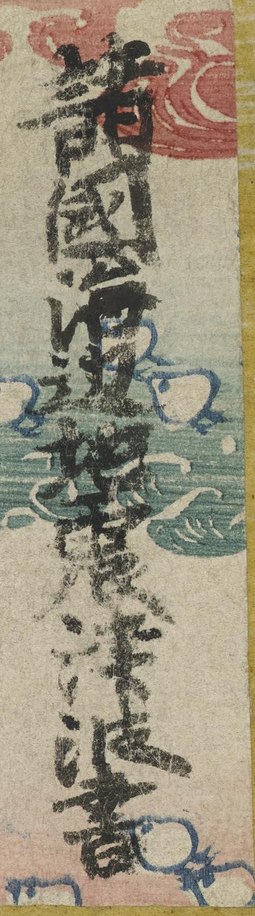諸国海辺地震津波書

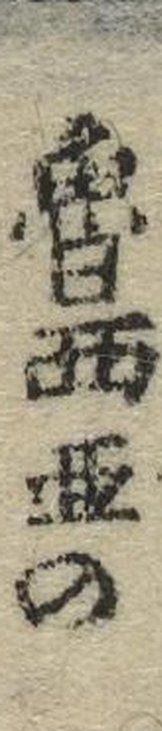魯西亜の
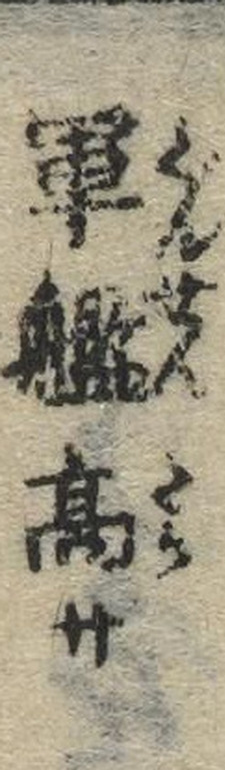軍艦高サ
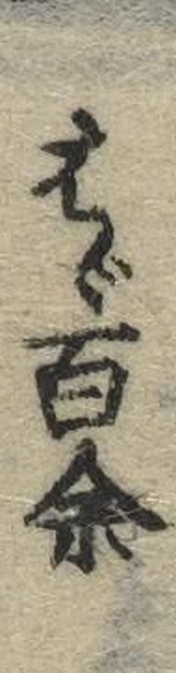はゞ百余
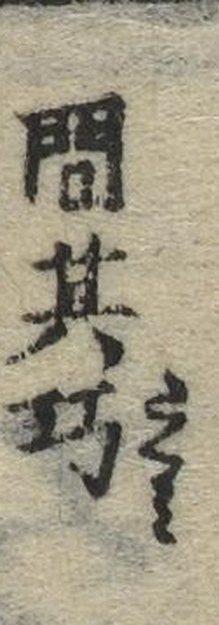間其巧
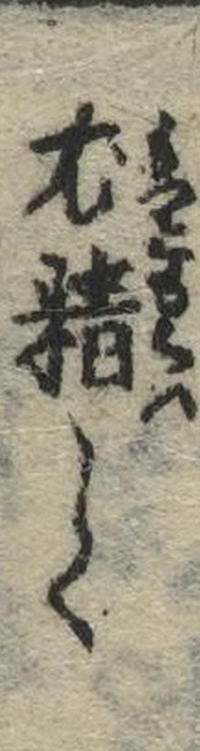尤精しく
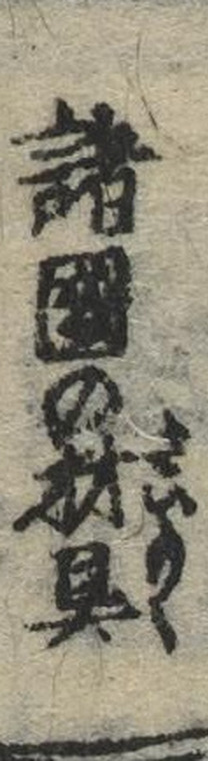諸国の材具
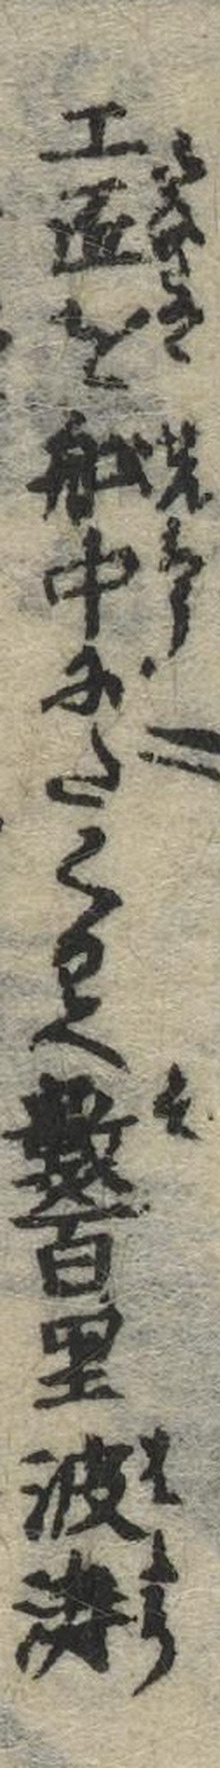工匠を船中にたくわへ数百里波濤
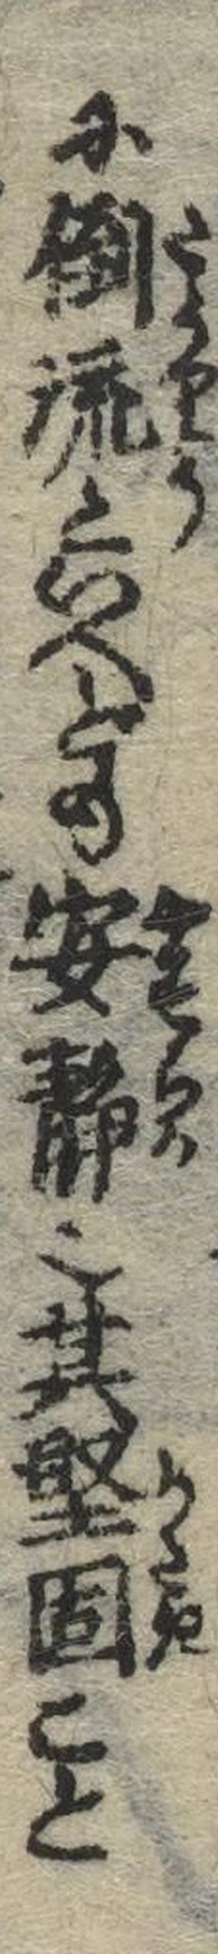に倒流といへども安静也其堅固こと
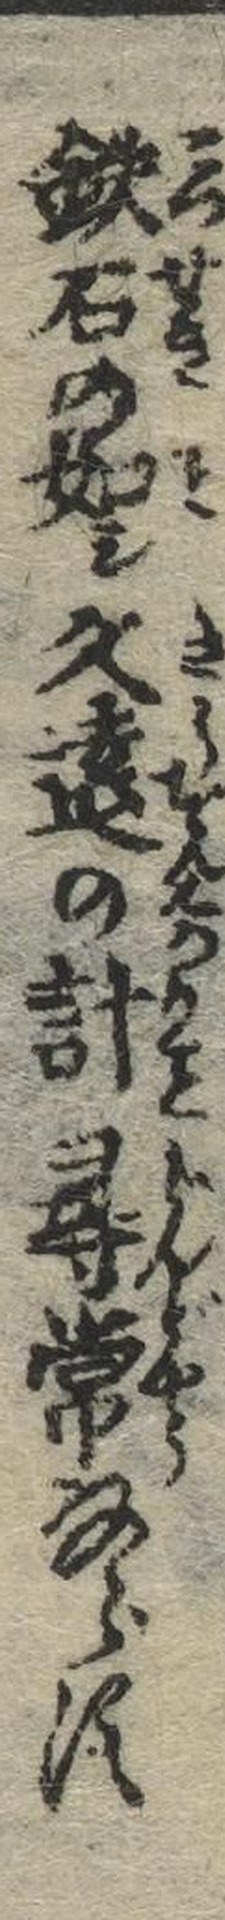鉄石の如シ久遠の計尋常ならす

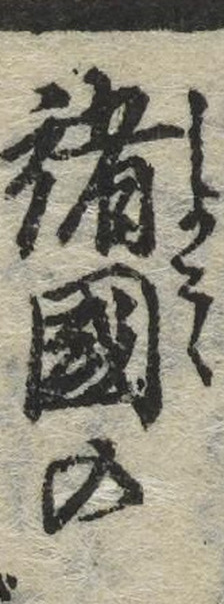諸国の
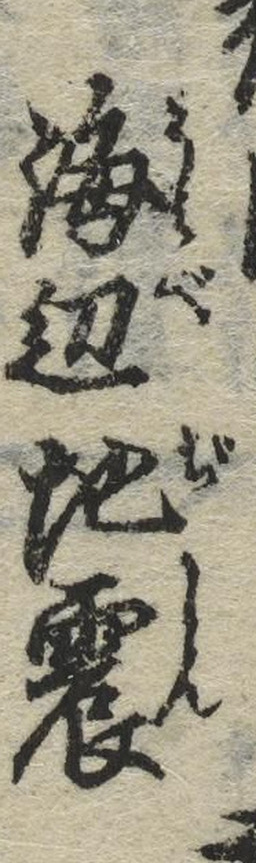海辺地震
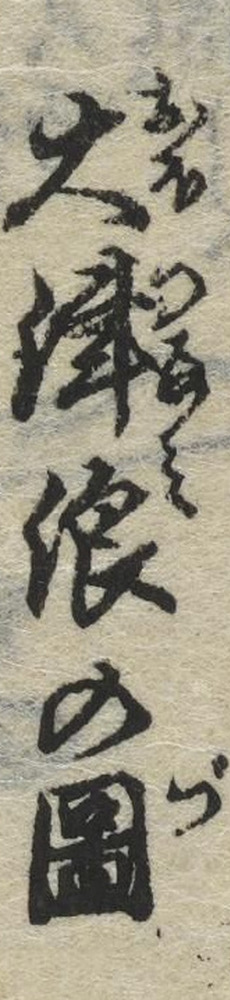大津浪の図
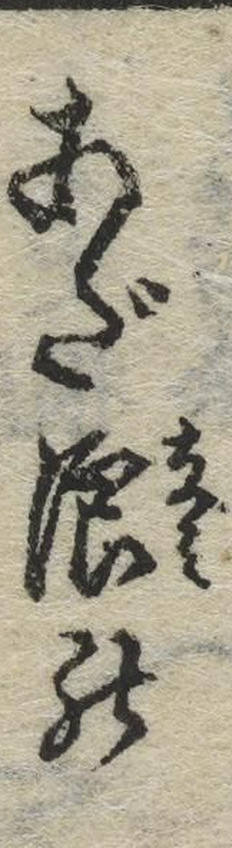あだ浪の
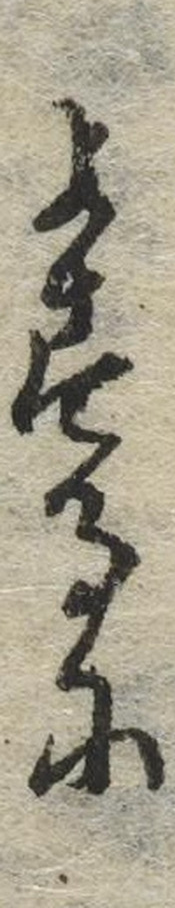よするに
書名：諸国海辺地震津波書
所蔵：東京大学地震研究所図書室 Earthquake Research Institute Library, The University of Tokyo, JAPAN
